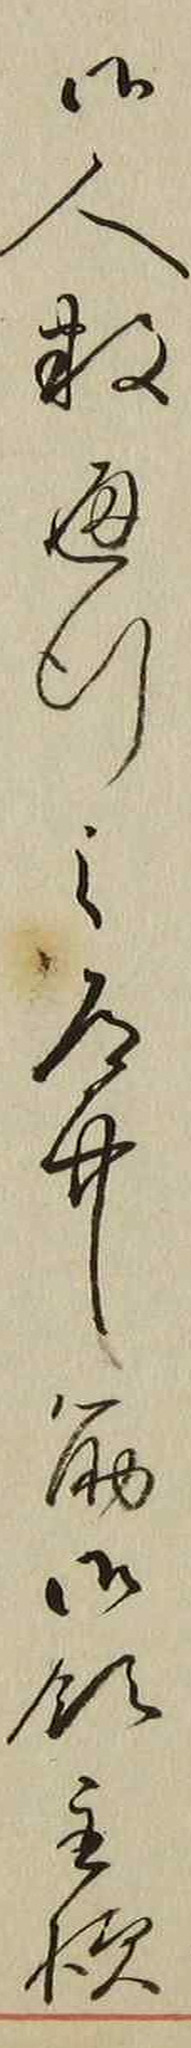御人数通行之道中筋御領主様
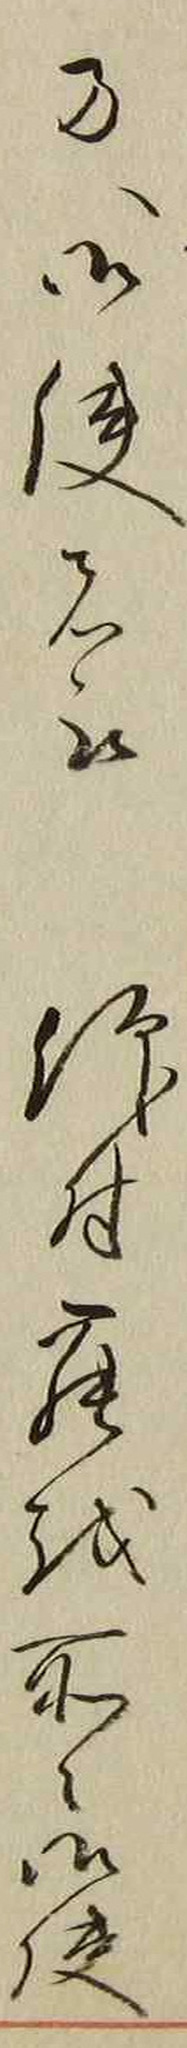方へ御使者被仰付罷越所々御使
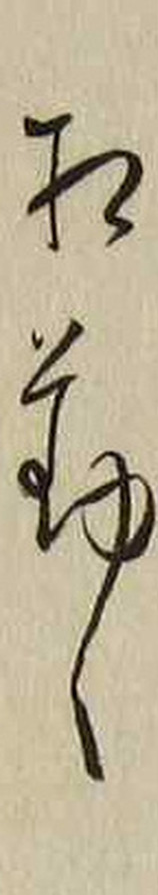相勤候
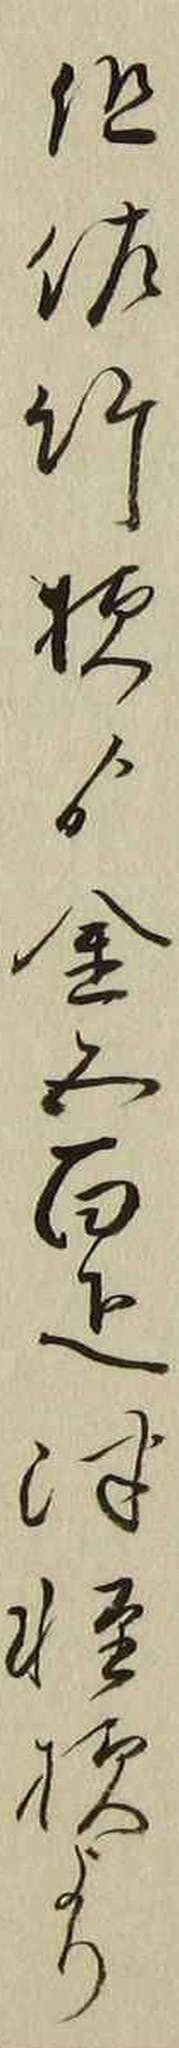但佐竹様より金五百疋津軽様より
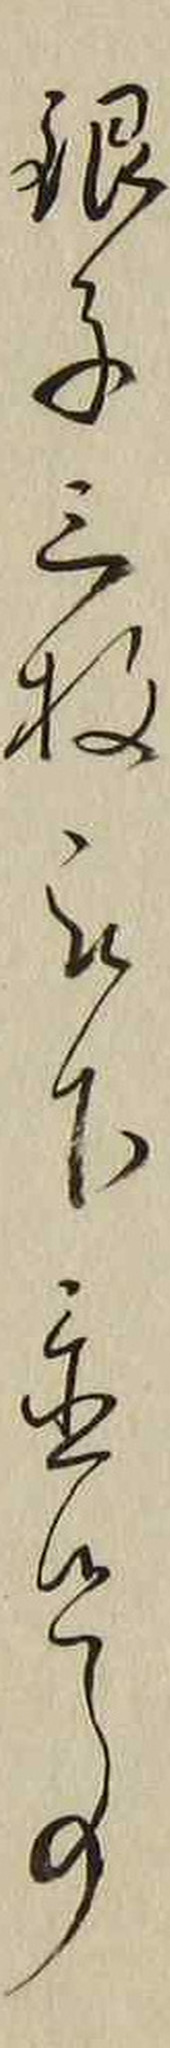銀子三枚被下置候事
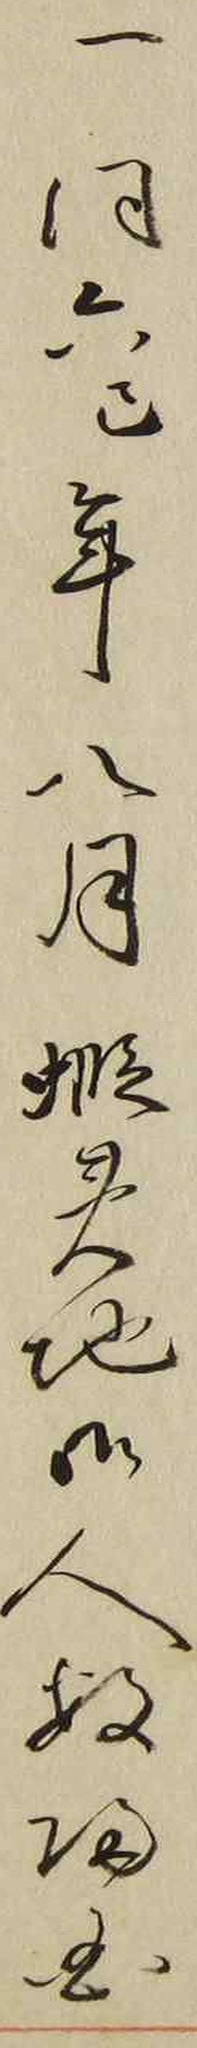一同六巳年八月蝦夷地御人数帰国

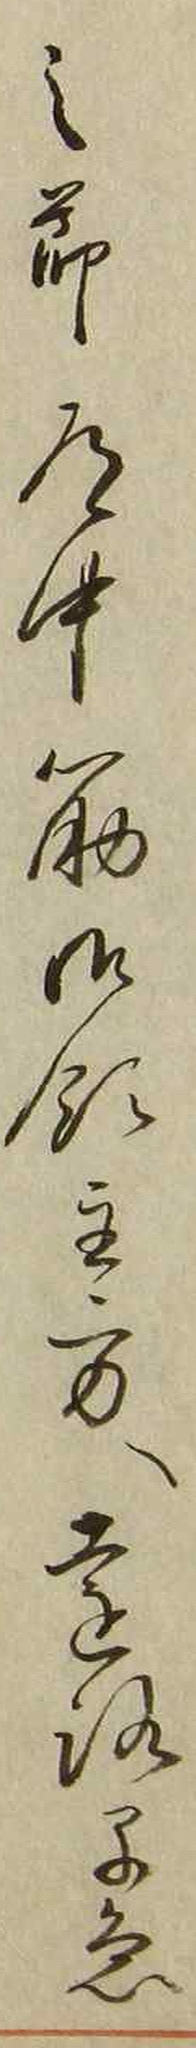ゟ之節道中筋御領主方へ遠路早急
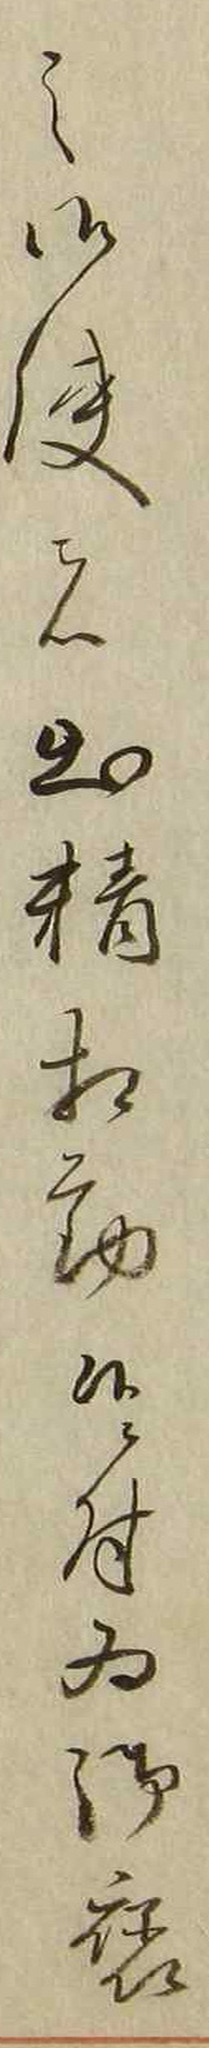之御使者出精相動候に付為御褒
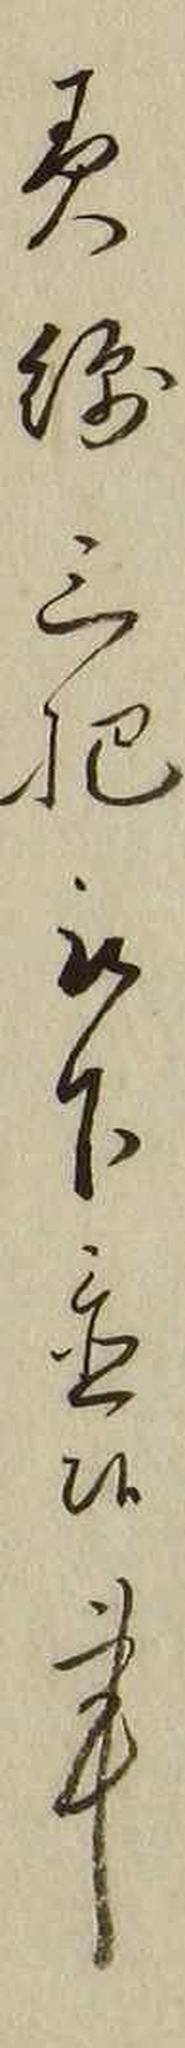美綿三把被下置候事
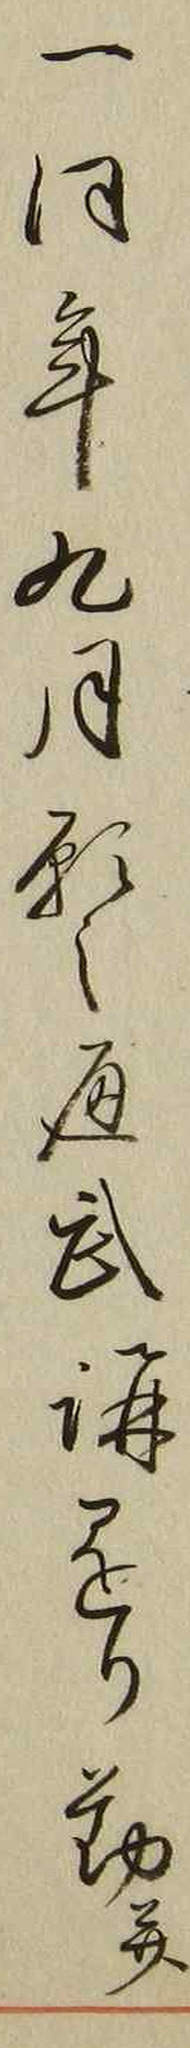一同年九月願之通武講懸り勤并
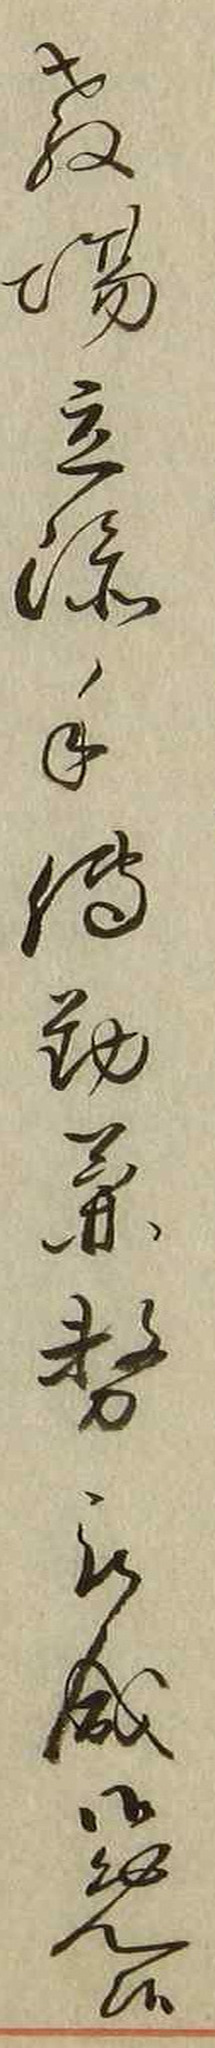教場立添手伝勤兼務被成御免候
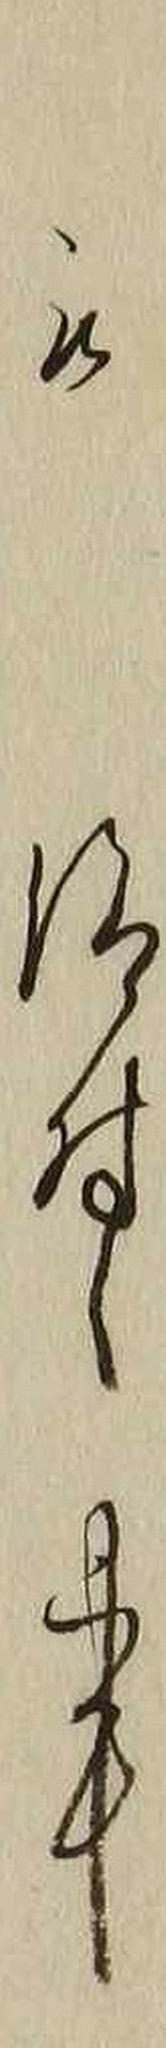被仰付候事
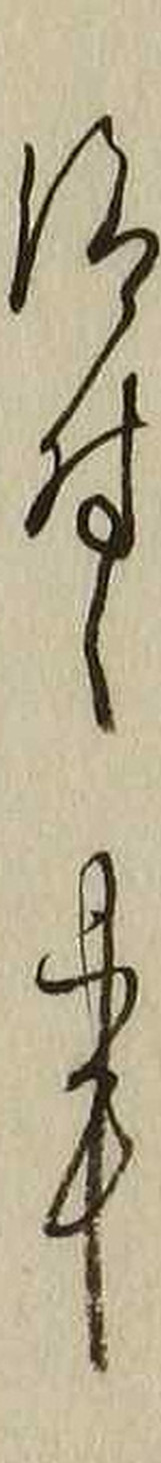仰付候事
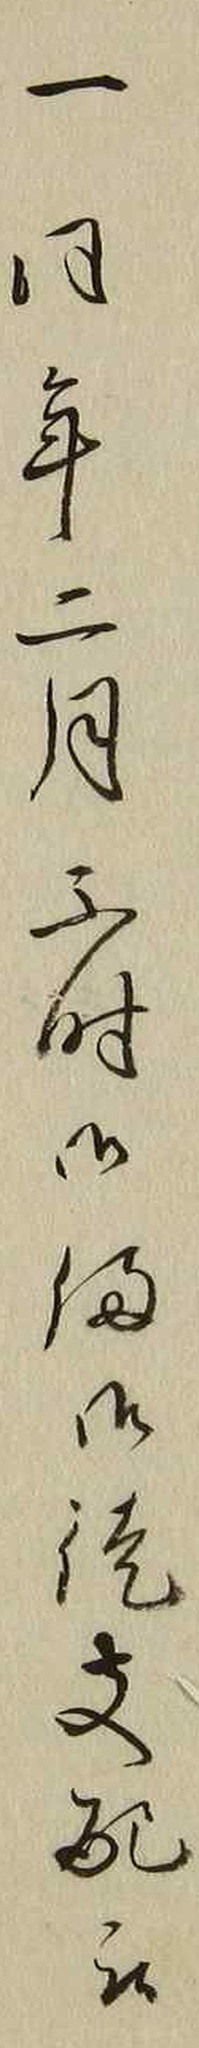一同年二月不時御備御徒支配被
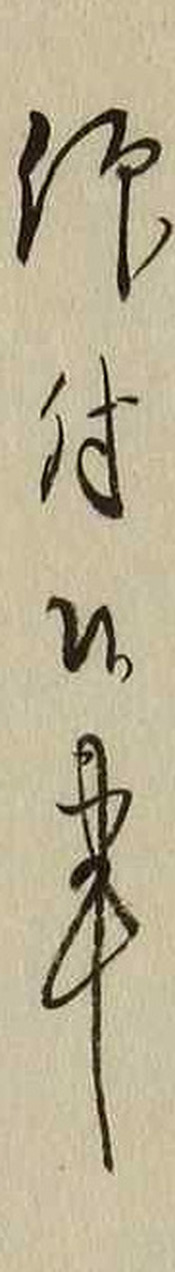仰付候事
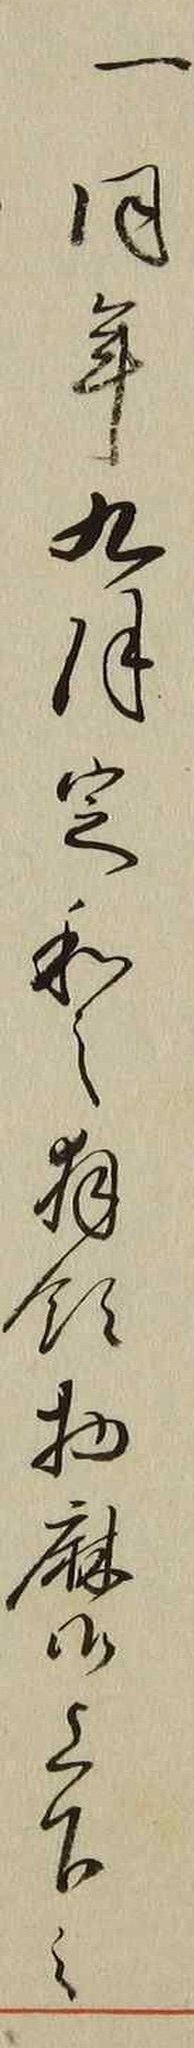一同年九月定和之拝領物麻御上下之
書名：諸士系譜　巻之1　い之部1
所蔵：会津若松市立会津図書館
